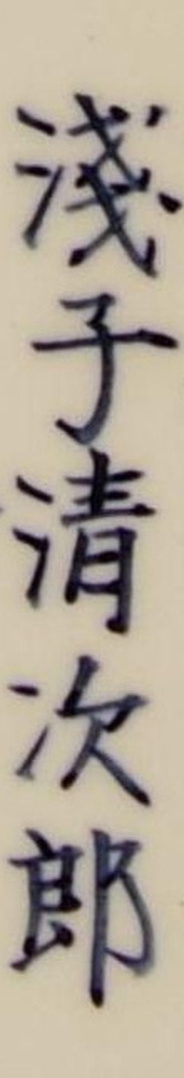浅子清次郎
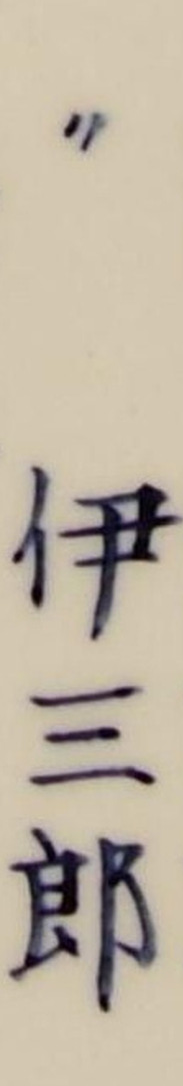伊三郎
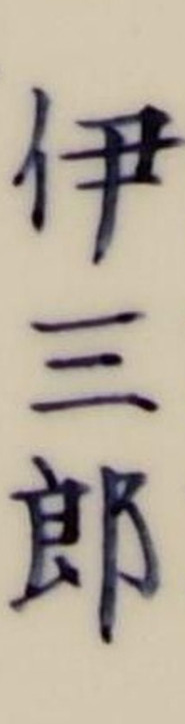伊三郎
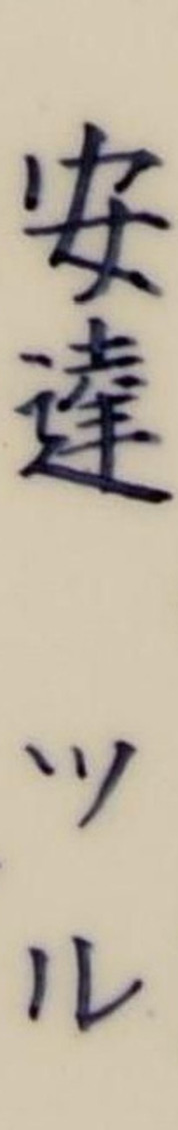安達ツル
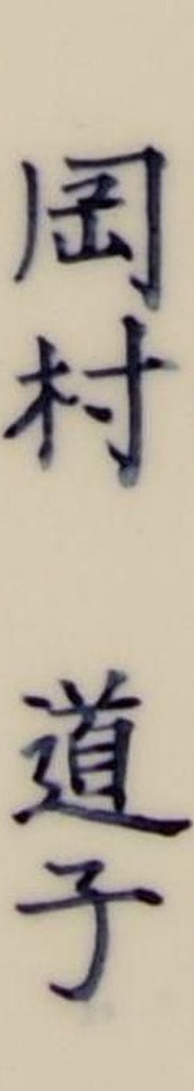岡村道子
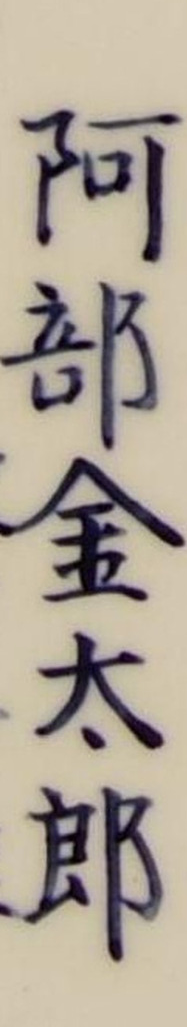阿部金太郎
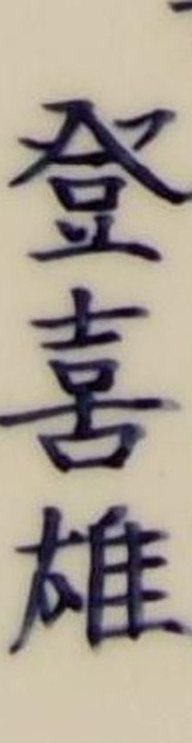登喜雄
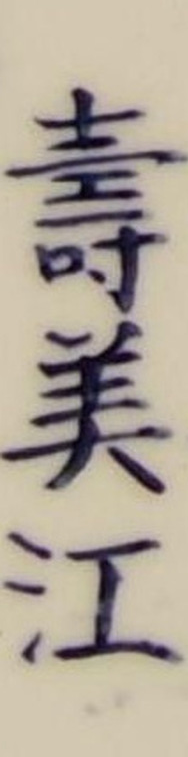壽美江
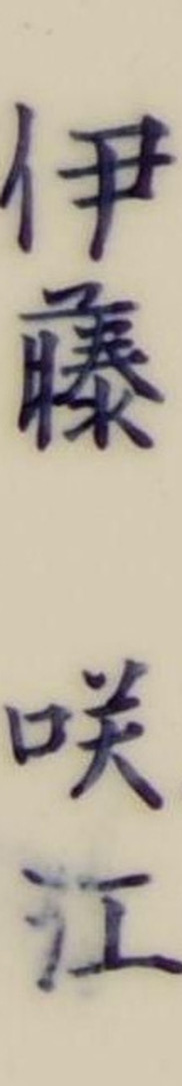伊藤咲江
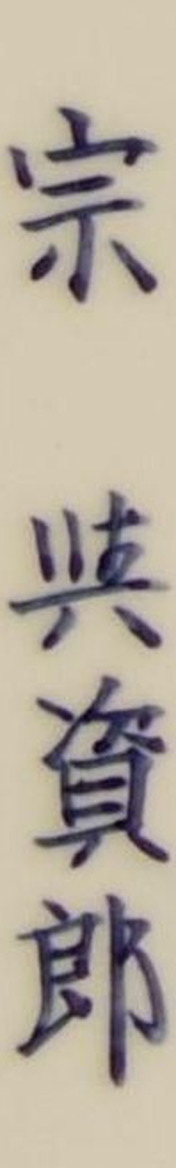宗与資郎
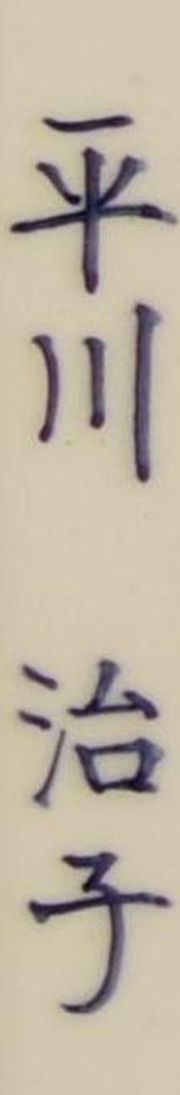平川治子

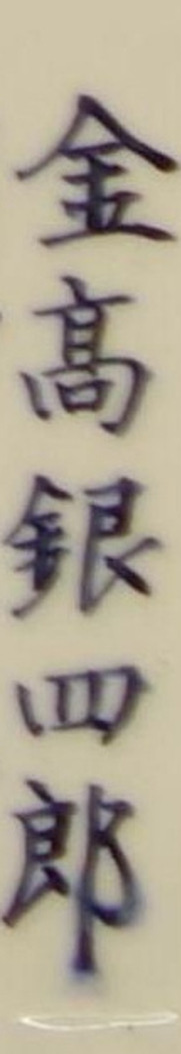金高銀四郎
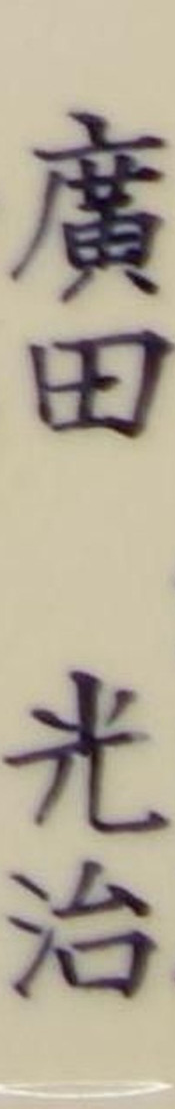廣田光治
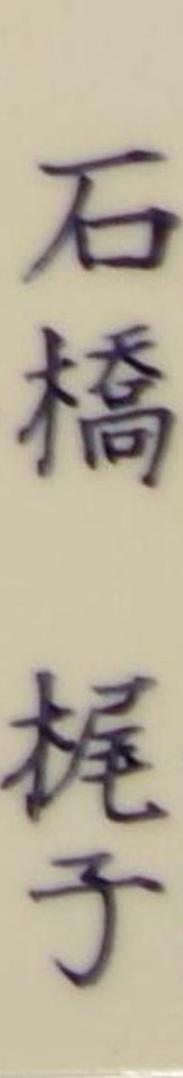石橋梶子
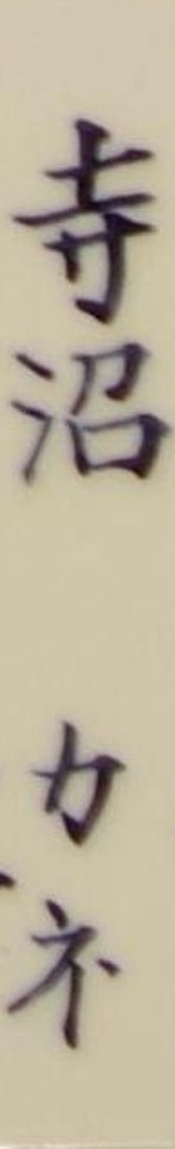寺沼カネ
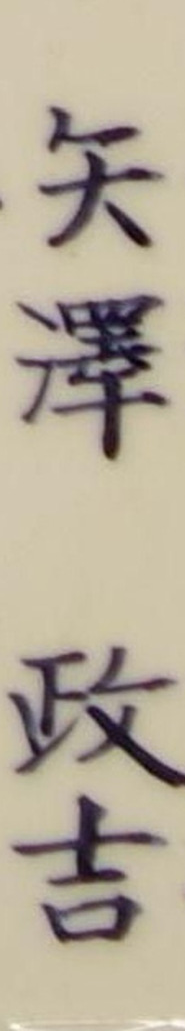矢澤政吉
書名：E~L
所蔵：高野山金剛峯寺
